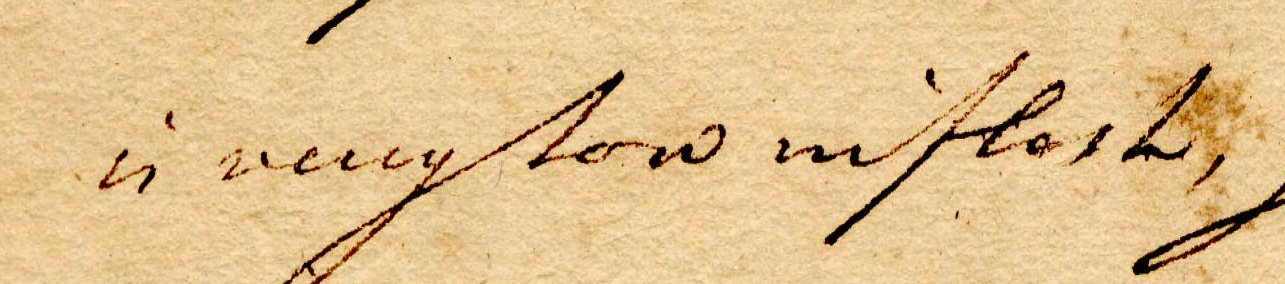is very low in flesh,
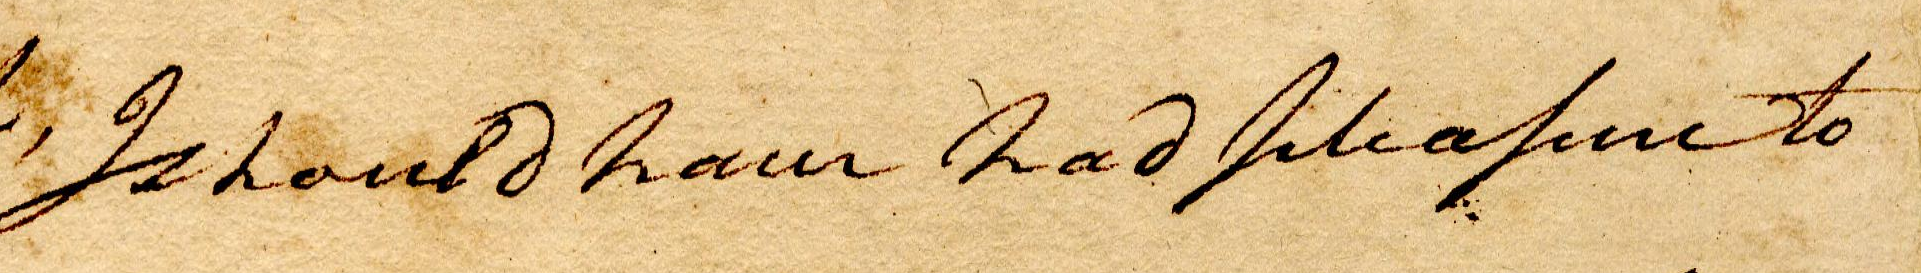I should have had pleasure to
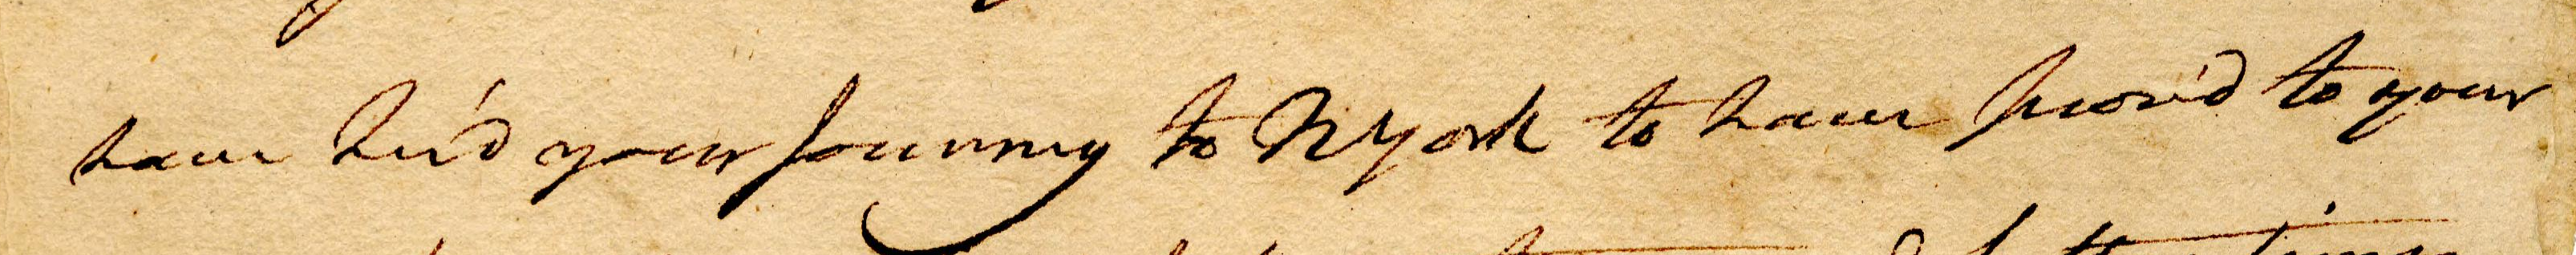have her'd you Journey to N York to have prov'd to your
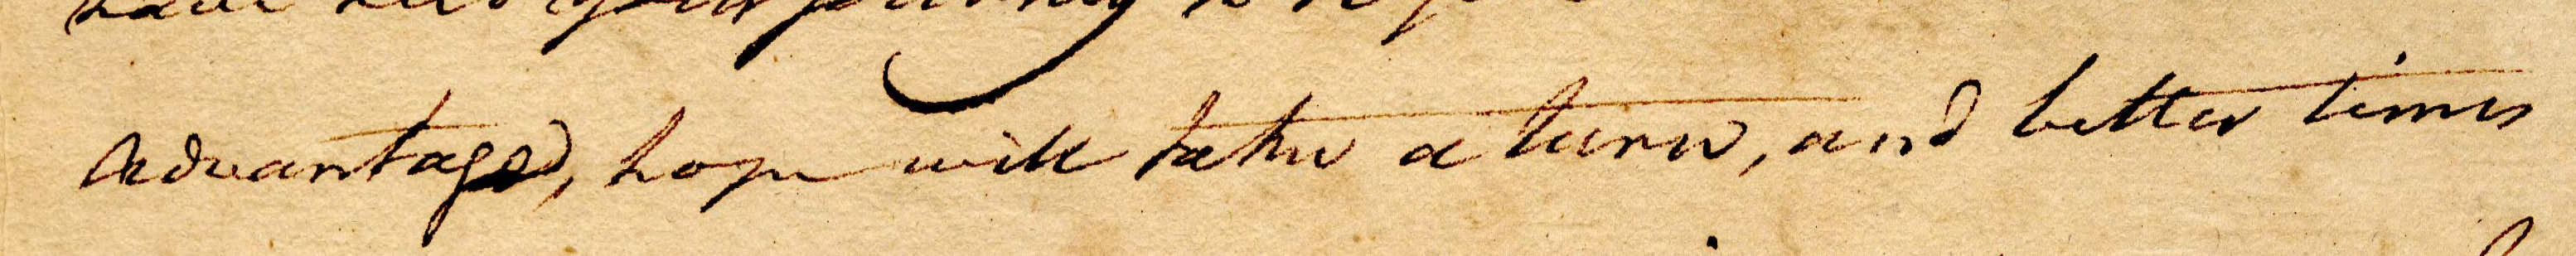advantage, hope will take a turn, and better times
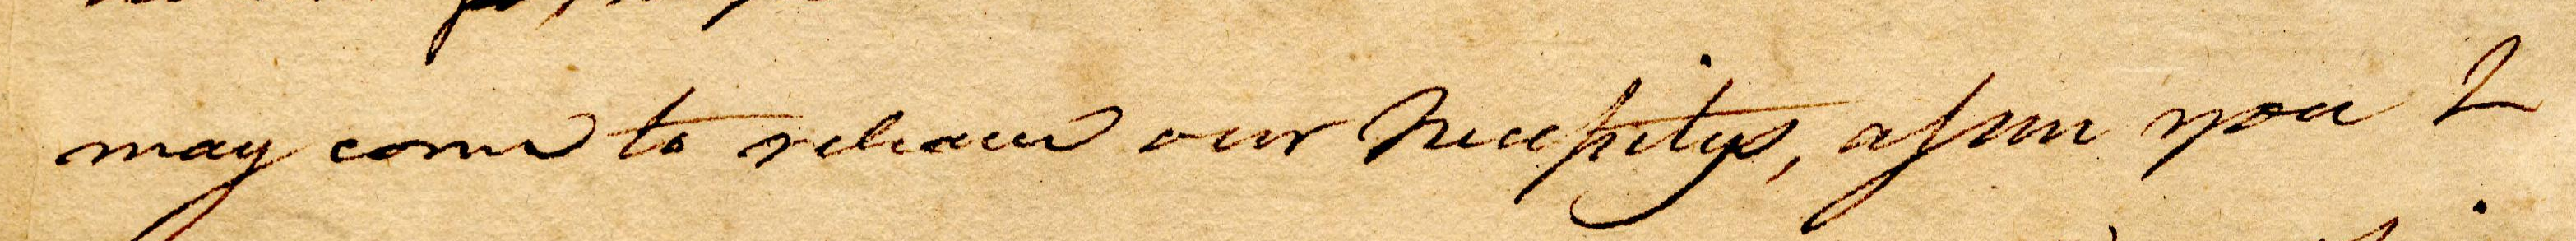may come to relieve our necessitys, a sum you l
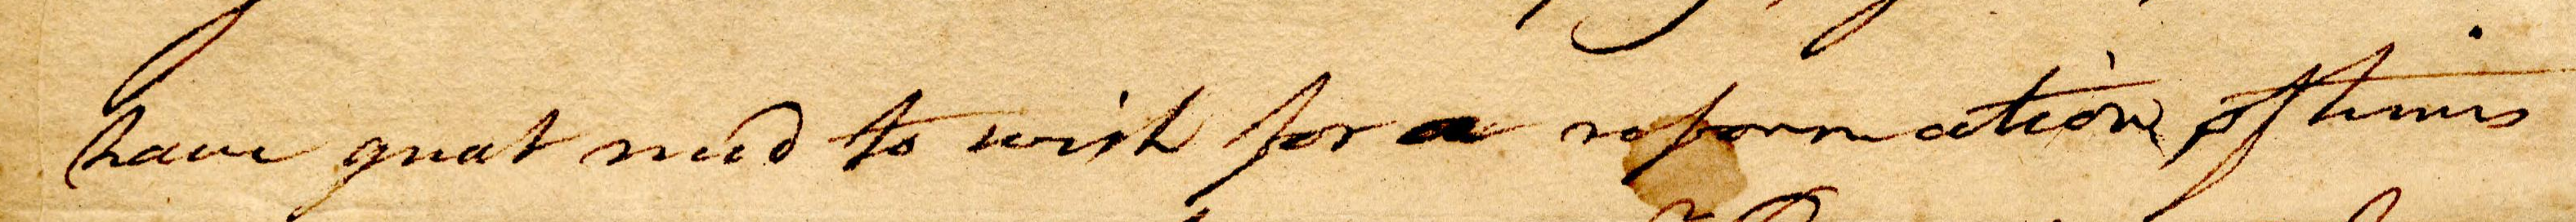have great need to wish for [a] return action of this
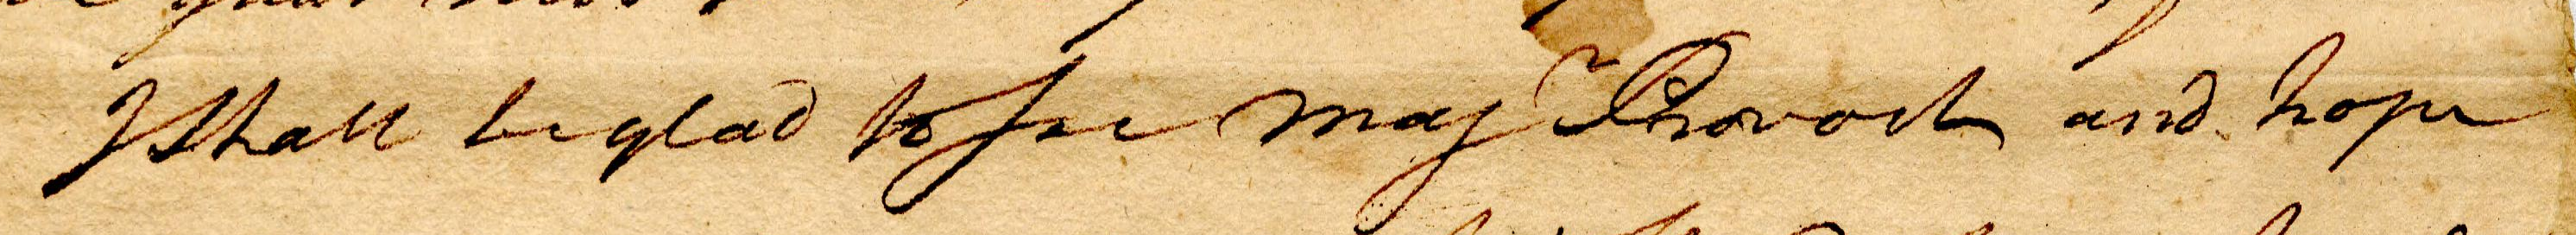I shall be glad to see Maj^r Provost and hope
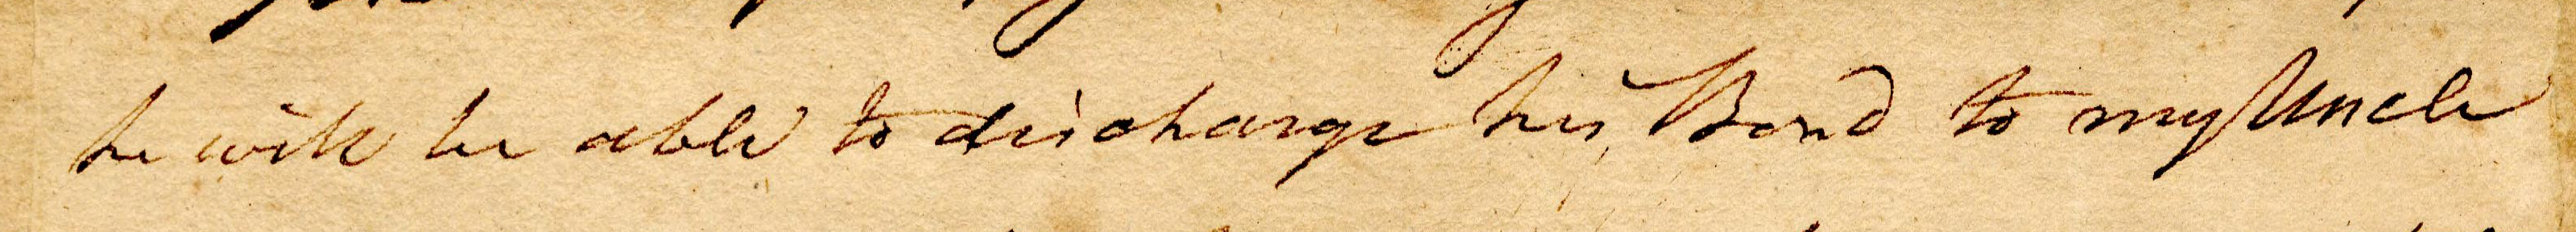he will be able to discharge his Bond to my Uncle
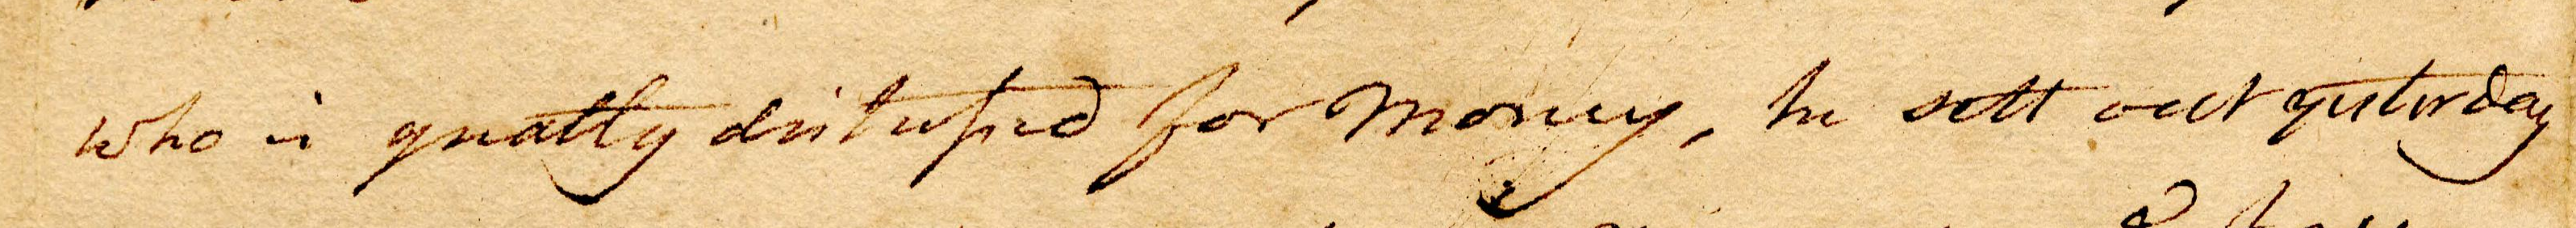who is greatly distressed for money, he sett out yesterday,
